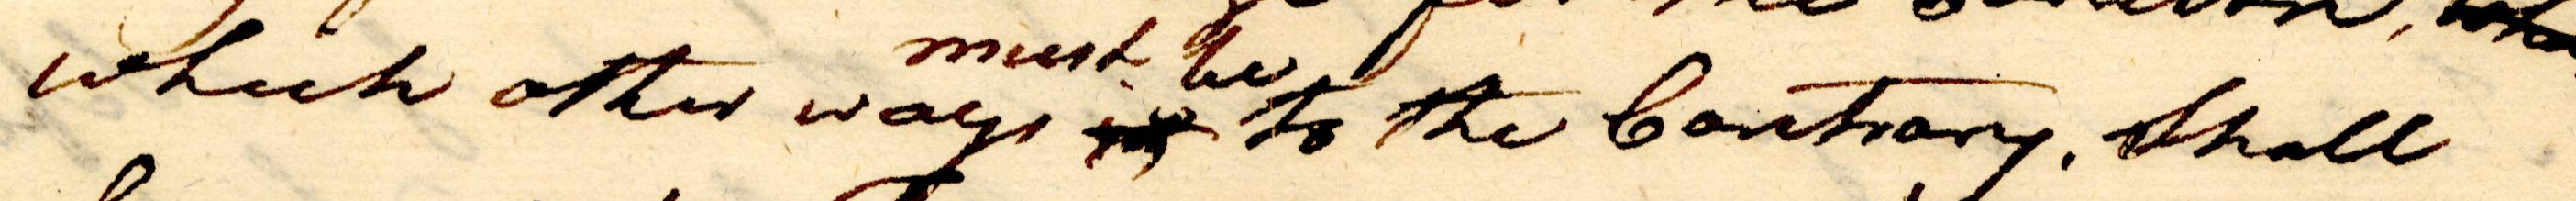with other ways [is] to the contrary. Shall
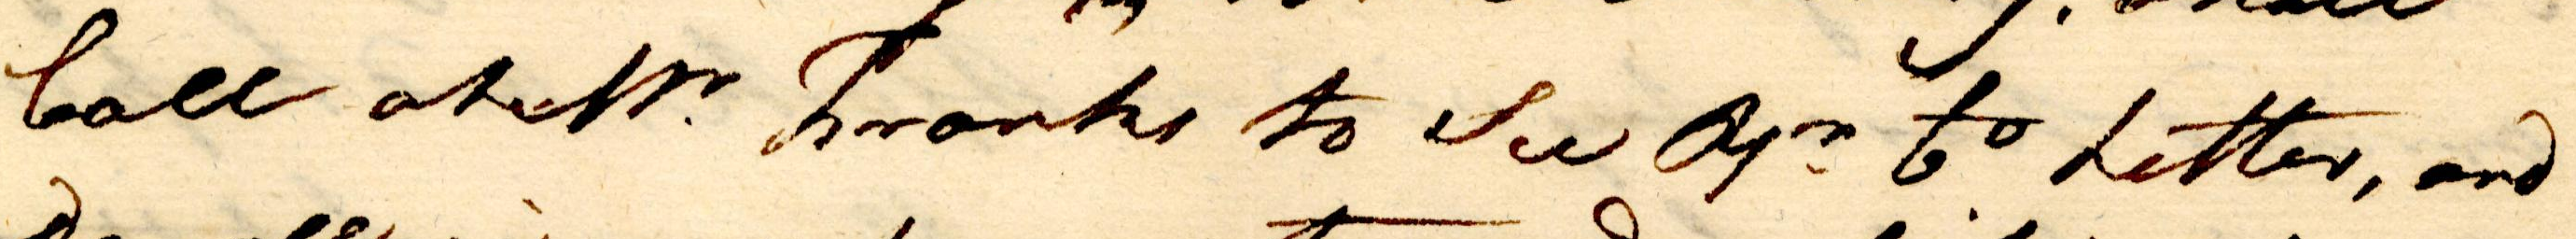call at M^r. Franks to see y^r. to Letter, and
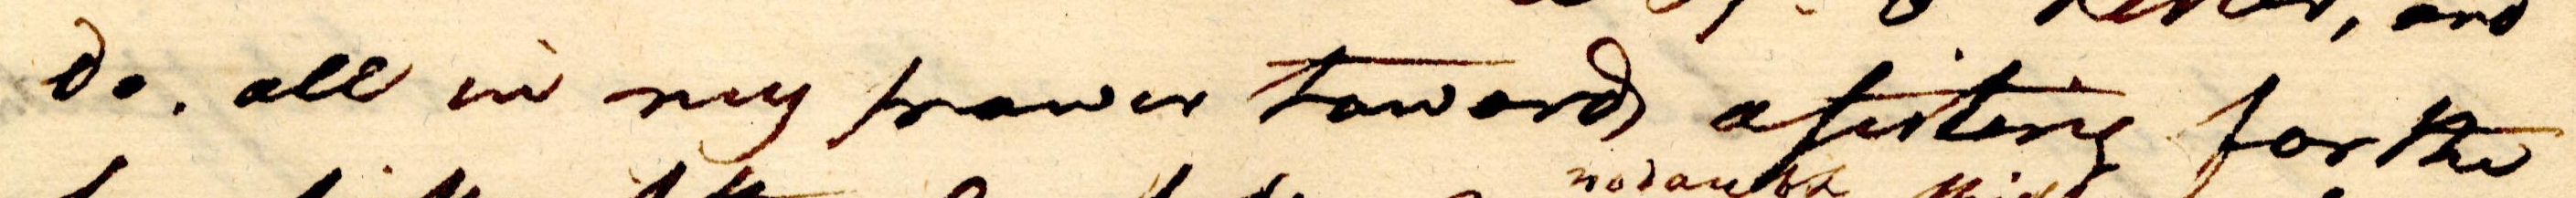do, all in my power towards asisting for the
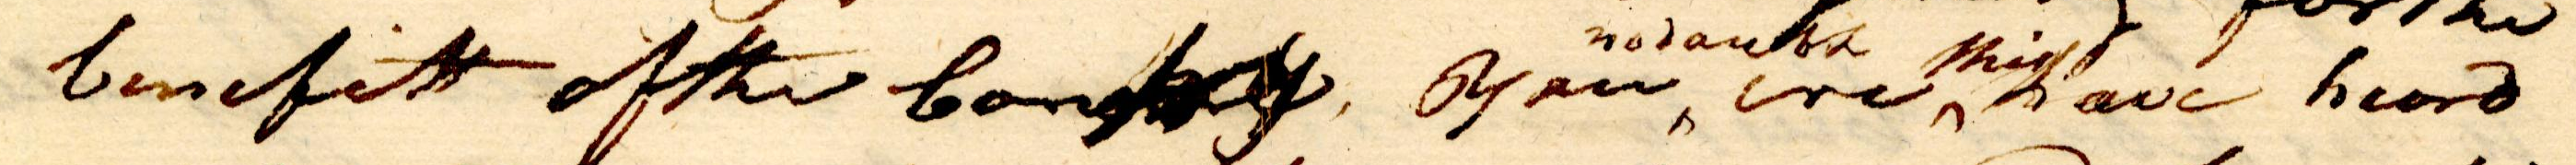benefit of the Con[_____] you ^ are ^ have heard
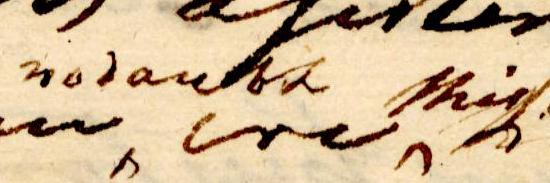no daubt this
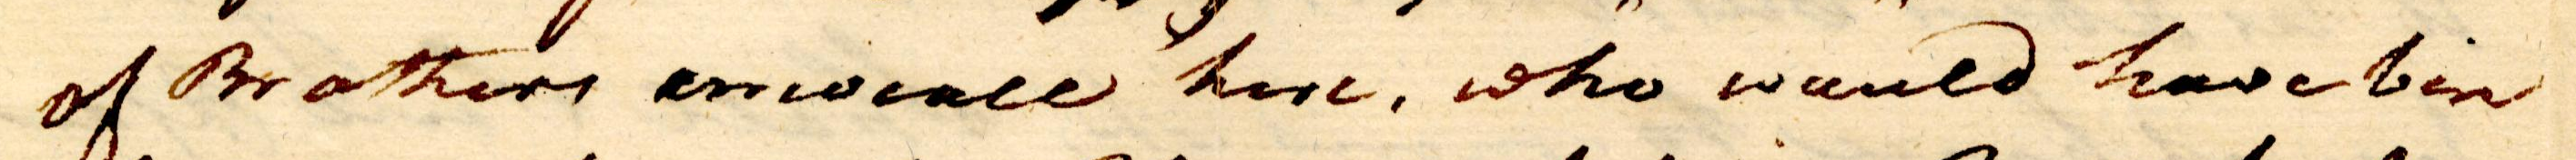of Brothers arrivance here, who would have bin
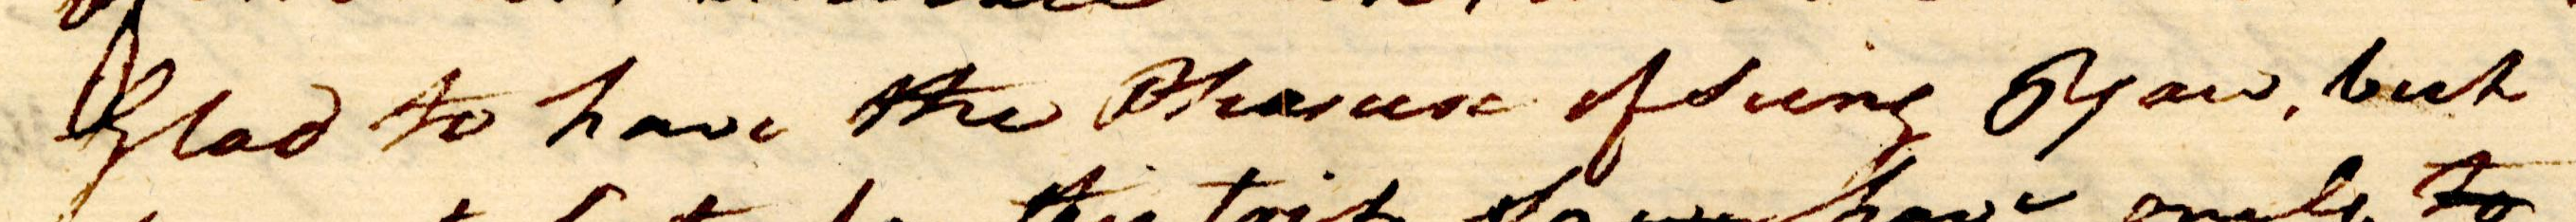glad to have the Pleasure of seeing you, but
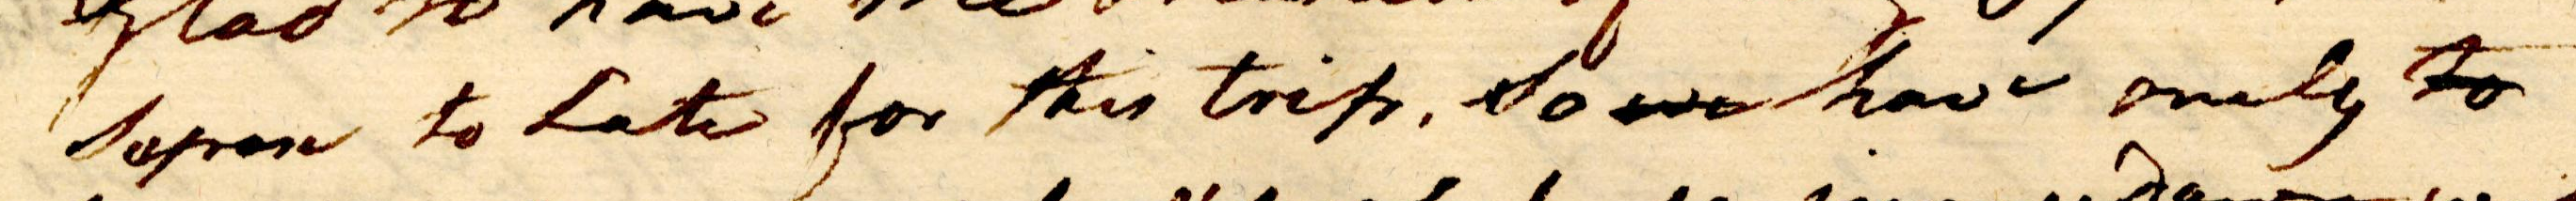supose to Late for this trip. so [we] have only to
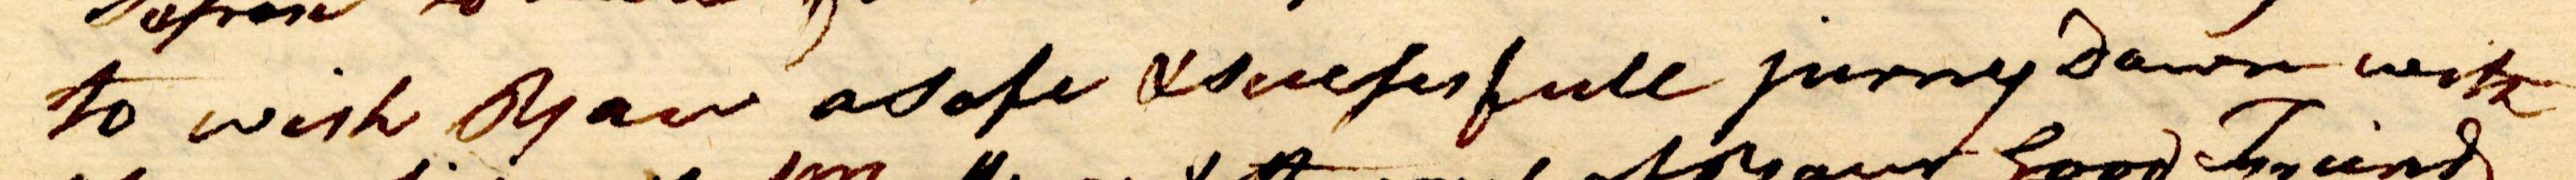to wish you a safe & succesfull journey down with
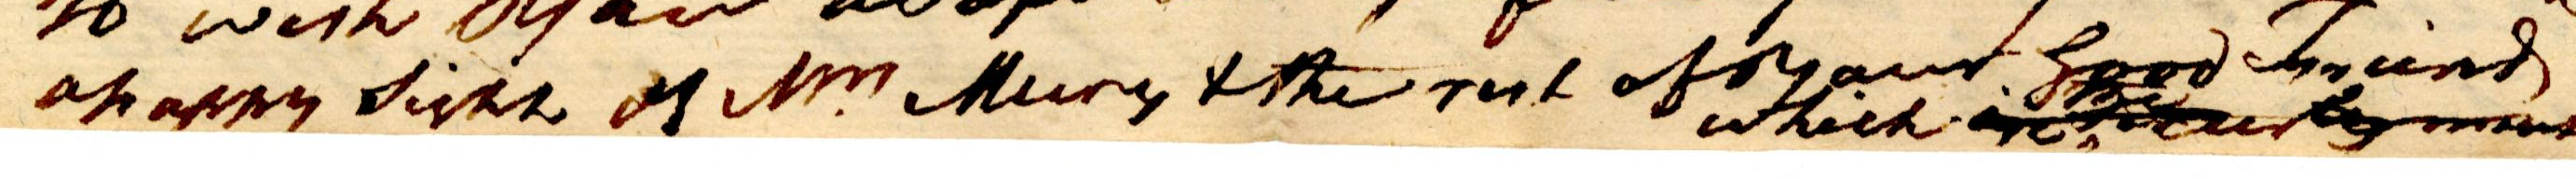a happy Sight by M^r. Mury & the rest of your friends
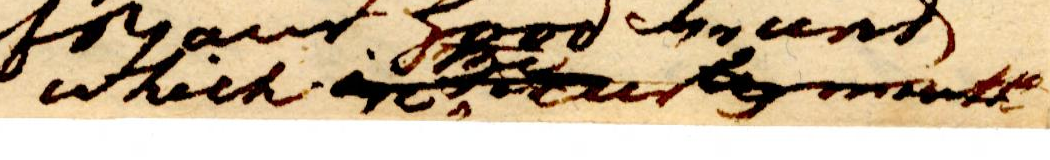which [___________]
